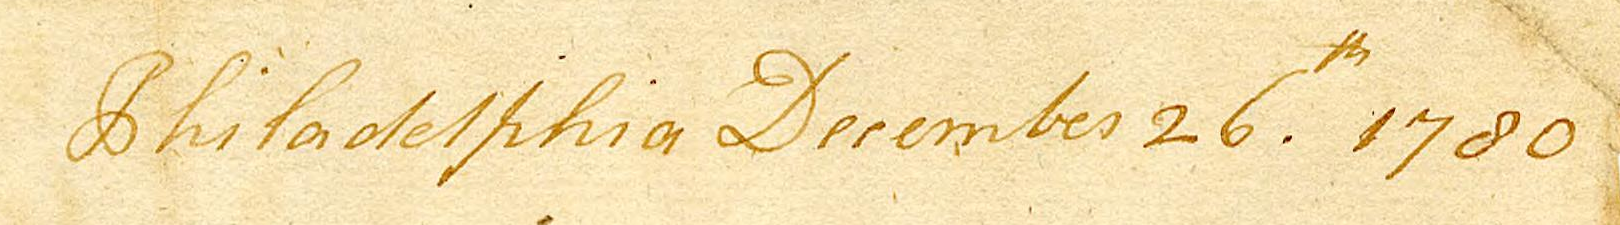Philadelphia December 26^th. 1780
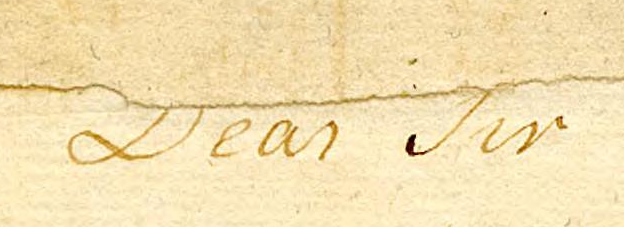Dear Sir
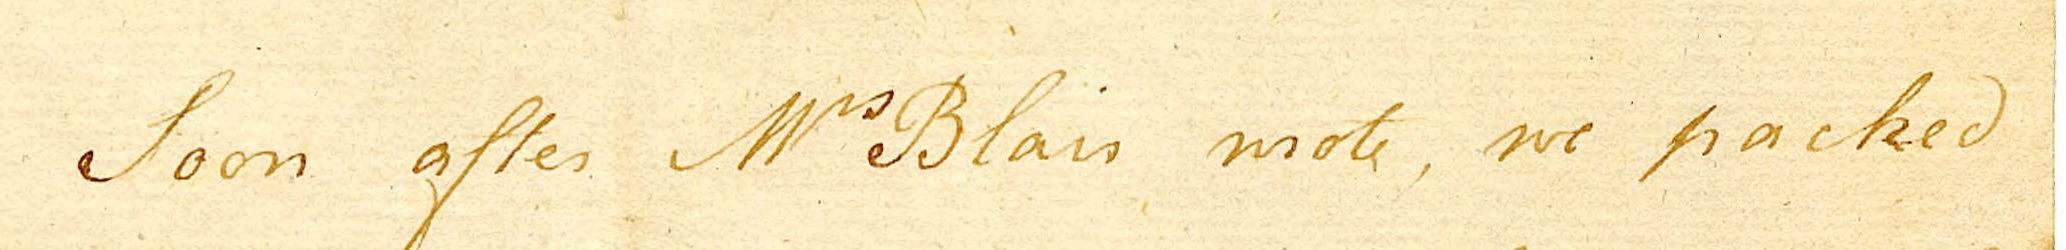Soon after M^rs Blair wrote we packed
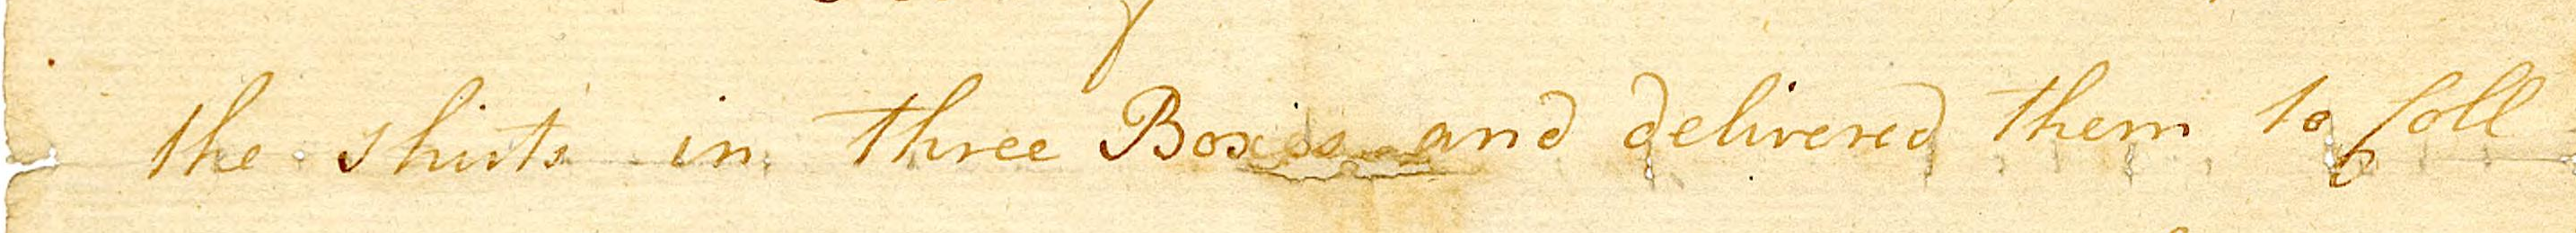the Shirts in three Boxes and delivered them to Coll
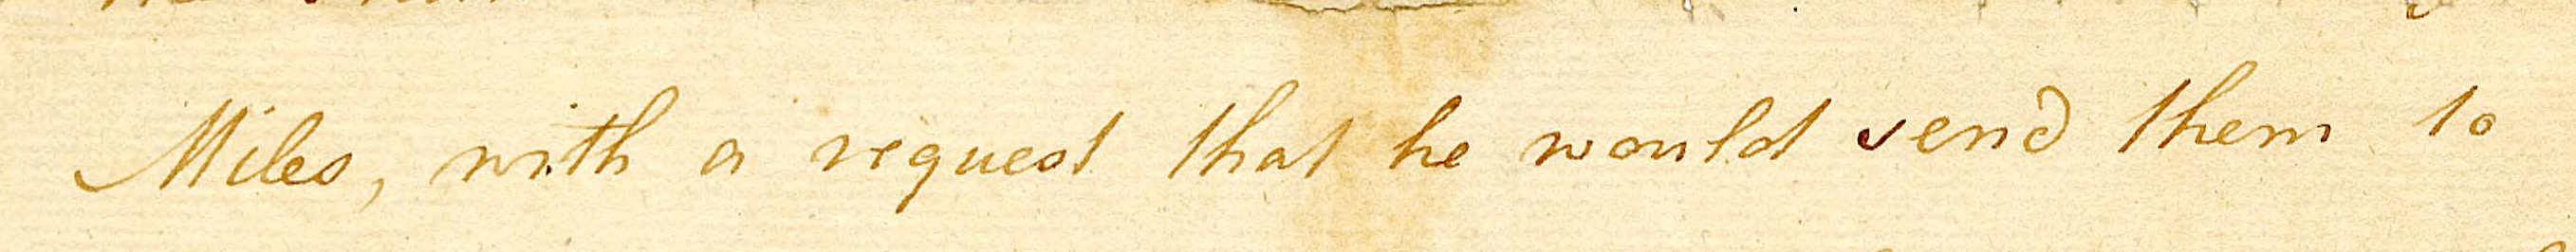Miles, with a request that he would send them to
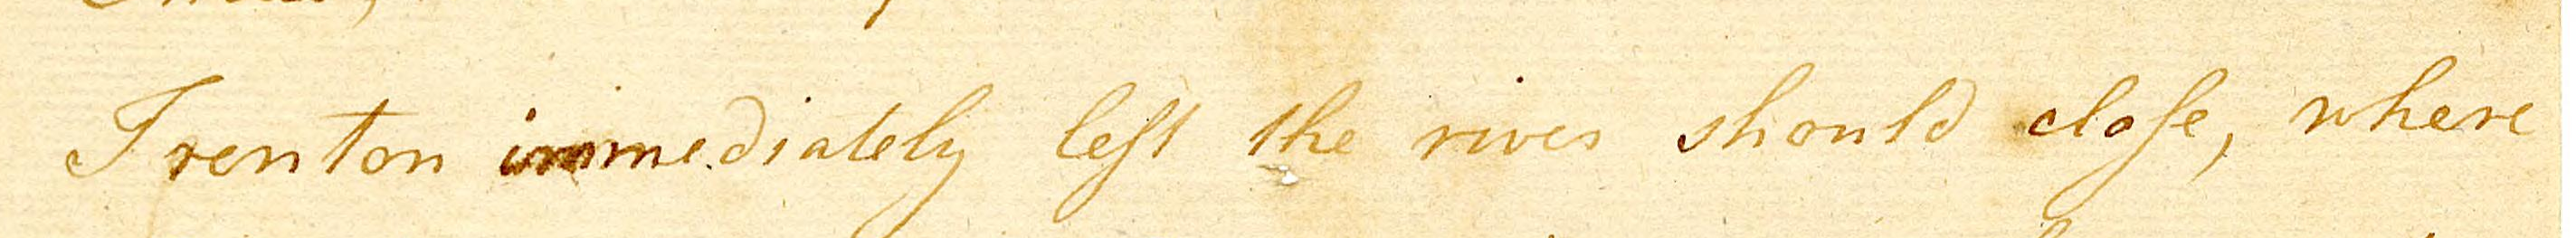Trenton immediately lest the river should close, where
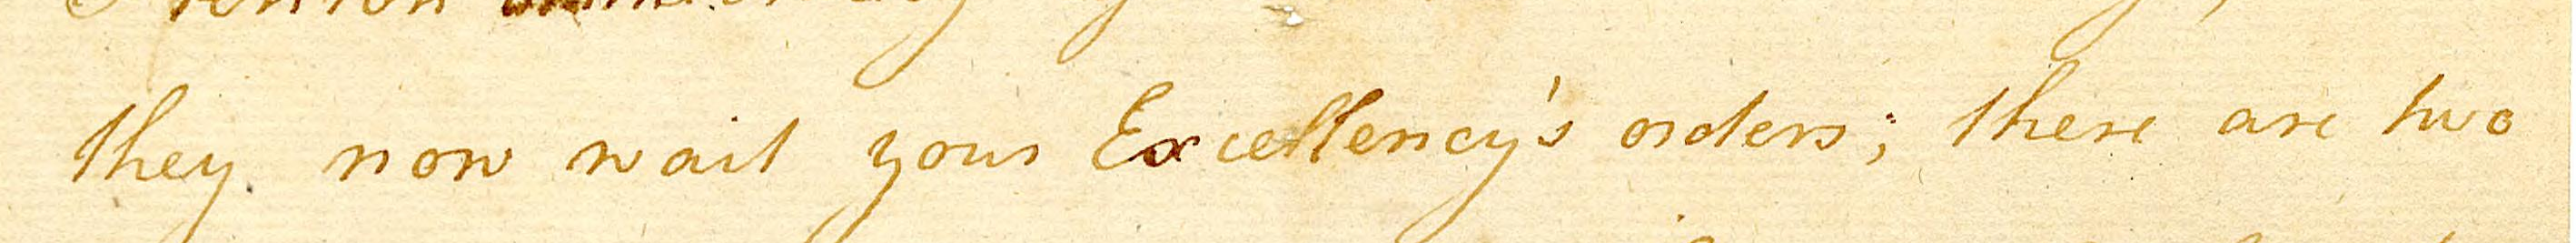they now wait your Excellency's orders; there are two
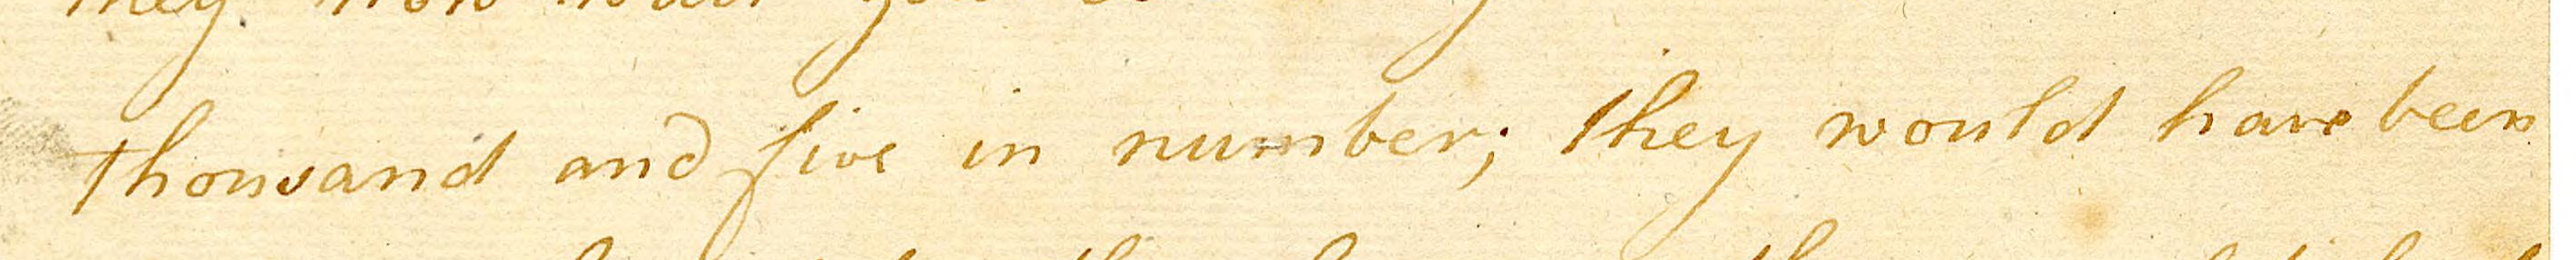thousand and five in number; they would have been
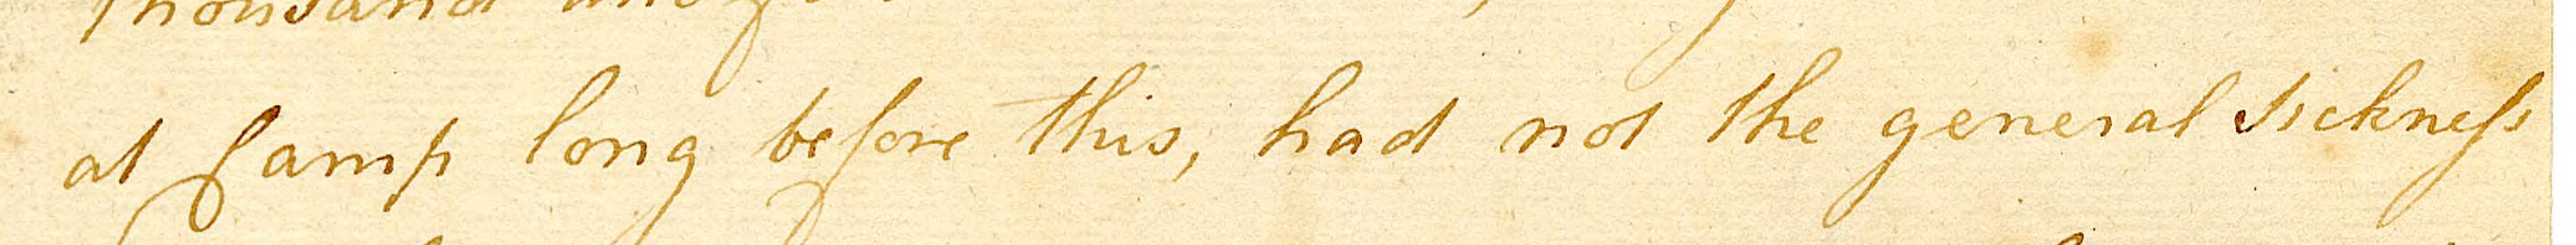at Camp long before this, had not the general Sickness
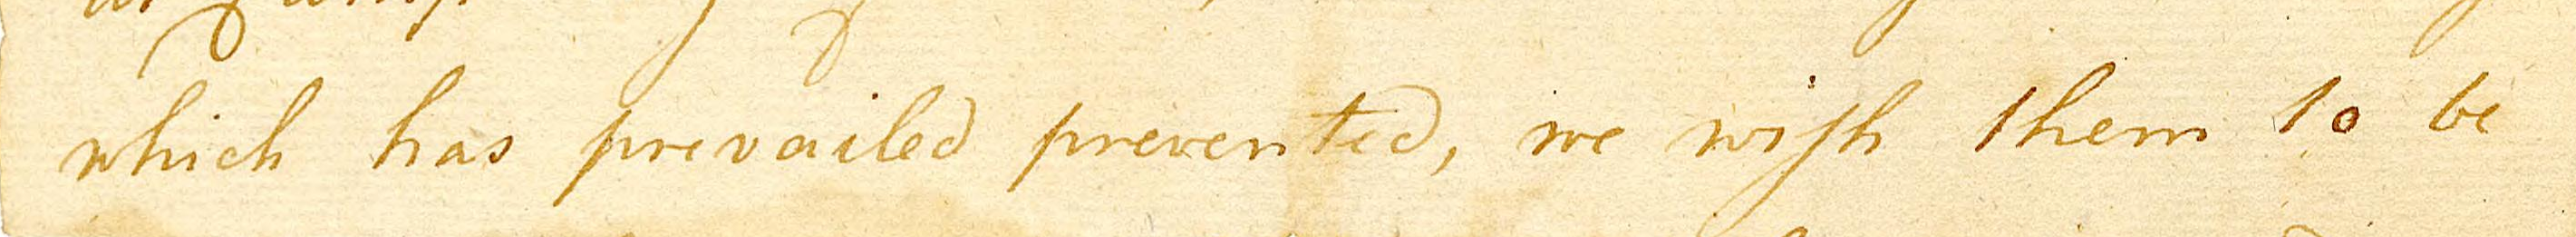which has prevailed prevented, we wish them to be
